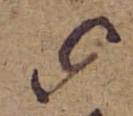5
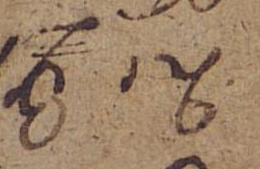2.3
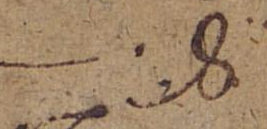8.-
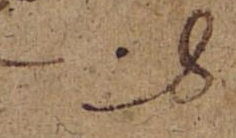8.-
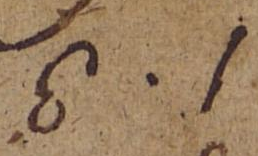1.3
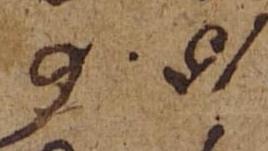15.6
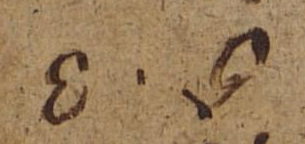5.3
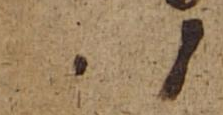1.
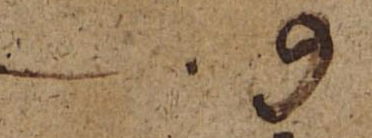6.-
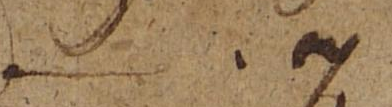2.-
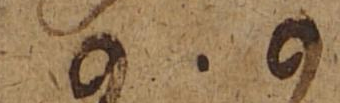6.6
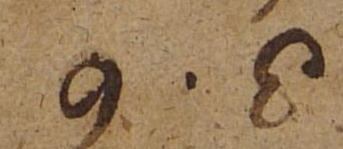3.6
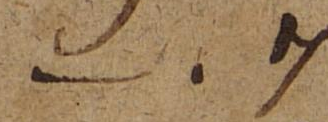4.-
